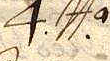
4. tt.a
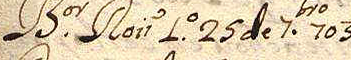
B.or Rois̄ 1.o 25 de 7.bro 703.
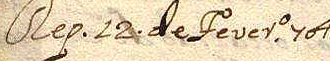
Rep. 12. de Fever.o 704.
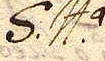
5. tt.a
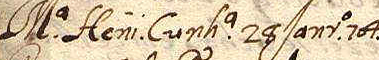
M.a Hen̄s. Cunh.a 28 Janr.o 704
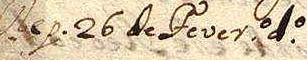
Rep. 26 de Fever.o d.o
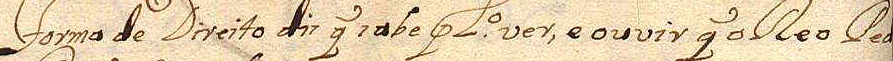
Forma de Direito dis q̄ sabe pL.o ver, e ouvir q̄ o Reo Ped
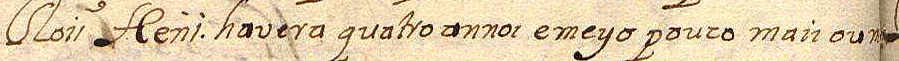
Rois̄ Hen̄s̄. havera quatro annos e meyo pouco mais ou m
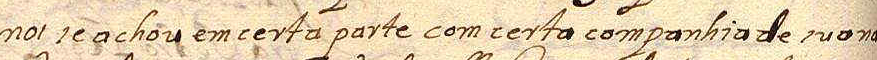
nos se achou em certa parte com certa companhia de sua na
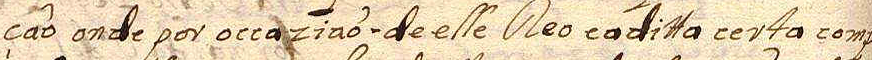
çaõ onde por occaziaõ - de elle Reo e a ditta certa compa
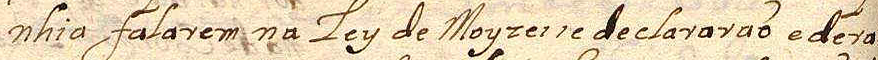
nhia falarem na Ley de Moyzes se declararaõ e deraõ
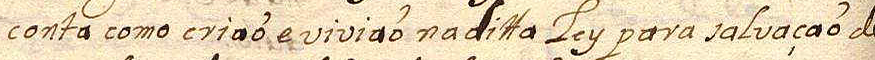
conta como criaõ e viviaõ na ditta Ley para salvaçaõ de
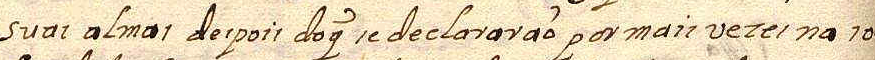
suas almas despois do q̄ se declararaõ por mais vezes na so
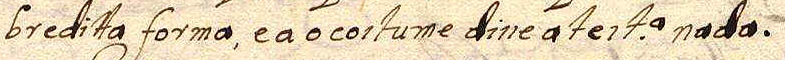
breditta forma, e ao costume disse a test.a nada.
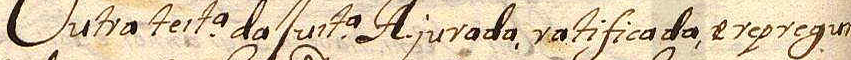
Outra test.a da Just.a A. jurada, ratificada, e repregun
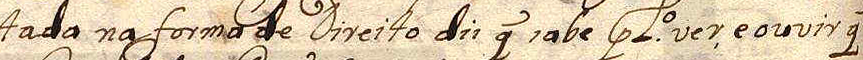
tada na forma de Direito dis q̄ sabe pL.o ver, e ouvir q̄
